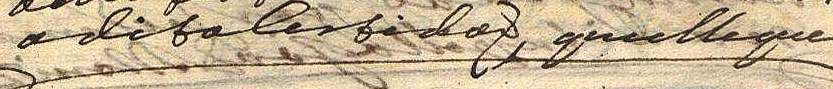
a dita Certidaõ, que elle que
